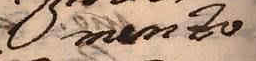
mento
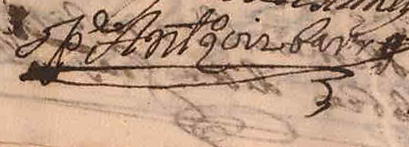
o pe Anto Roiz̄ barros
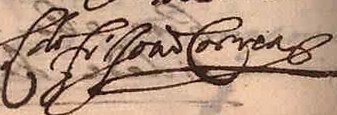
Ldo fr. Joaõ Correa
